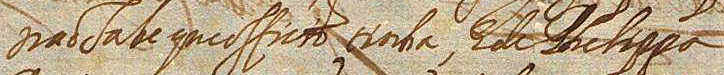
naõ sabe que officio tinha, E de Phelippa
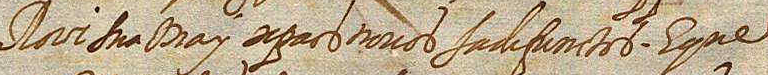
Roiz sua may xpaos nouos Ja defunctos. E que
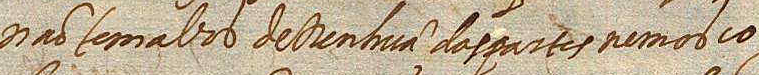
naõ tem aVos de nenhuā das partes nem os co
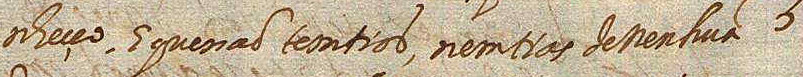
nheçeo, E que naõ tem tios, nem tias de nenhuā
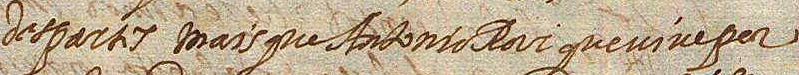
das partes mais que Antonio Roiz que uiue por
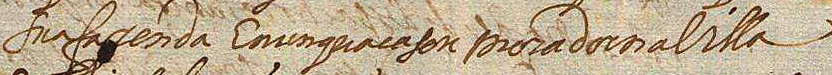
sua fazenda E nunqua casou morador na Villa
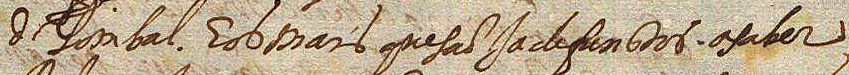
de Pombal. E os mais que saõ Ja defunctos. a saber
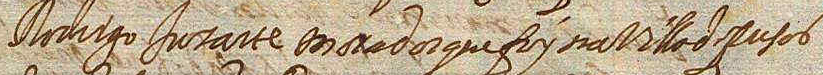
Rodrigo Juzarte morador que foy na Villa de pusos
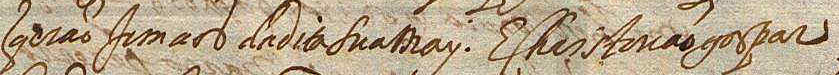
q̄ eraõ Jrmaõs da dita sua may. E Christouaõ gaspar
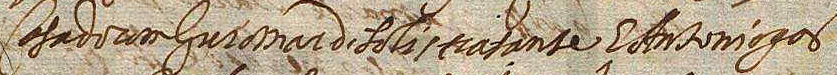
Casado com Guiomar de Solis tratante E Antonio gas
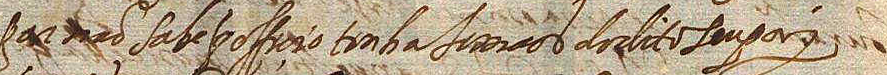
par naõ sabe q̄ offiçio tinha Jrmaõs do dito seu paj
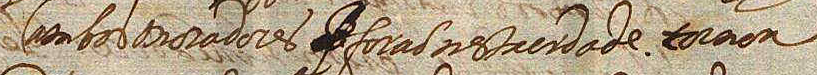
(ambos moradores q̄ foraõ nesta erdade. tornou
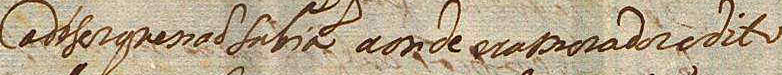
a diser que naõ sabia aonde era morador o dito
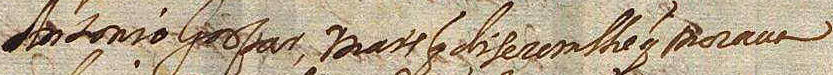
Antonio Gaspar, mais q̄ diseremlhe q̄ moraua
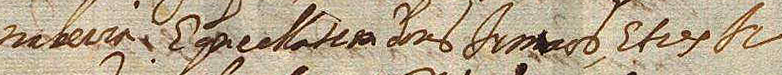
na beira. E que ella tem dous Irmaõs, E tres Ir
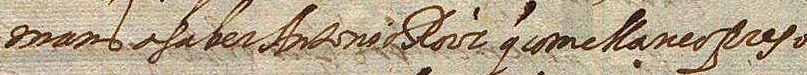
mañs a saber Antonio Roiz q̄ com ella ueo preso
